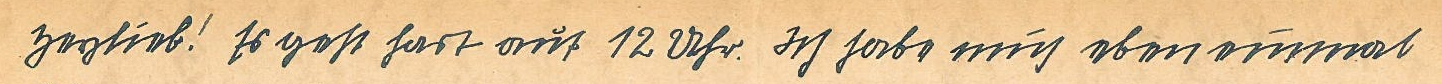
Herzlieb! Es geht hart auf 12 Uhr. Ich habe mich eben einmal
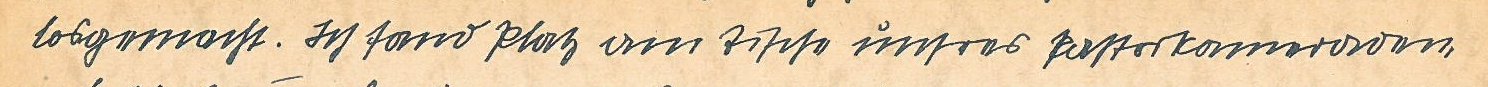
losgemacht. Ich fand Platz am Tisch unsres Pastorkameraden,
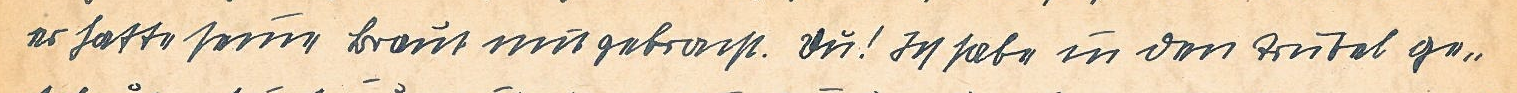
er hatte seine Braut mitgebracht. Du! Ich habe in den Trubel ge¬
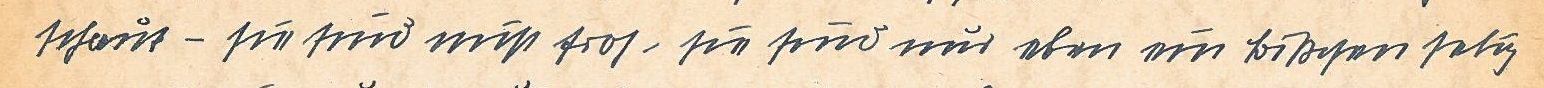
schaut — sie sind nicht froh, sie sind nur eben ein bißchen selig
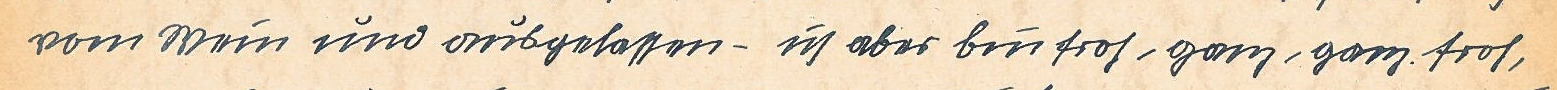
vom Wein und ausgelassen — ich aber bin froh, ganz, ganz froh,
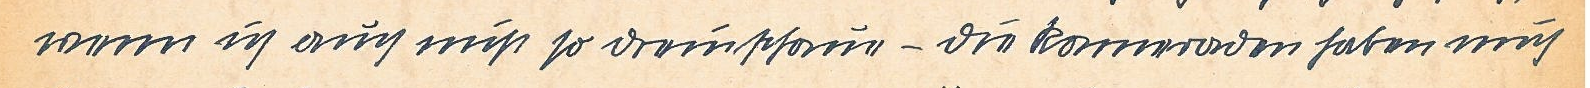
wenn ich auch nicht so dreinschaue — die Kameraden haben mich
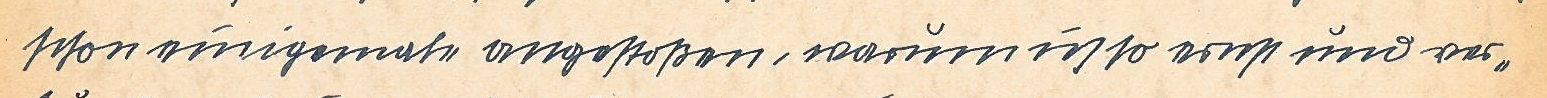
schon einigemale angestoßen, warum ich so ernst und ver¬
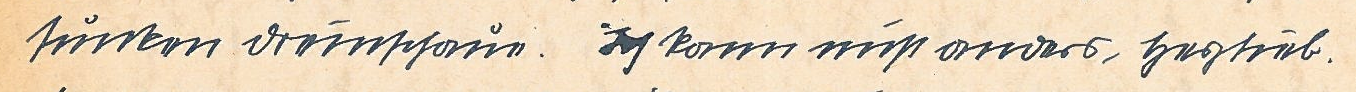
sunken dreinschaue. Ich kann nicht anders, Herzlieb.
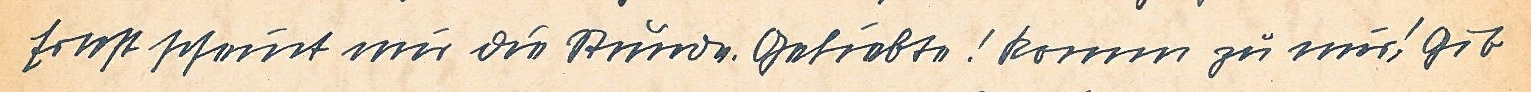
Ernst scheint mir die Stunde. Geliebte! Komm zu mir! Gib
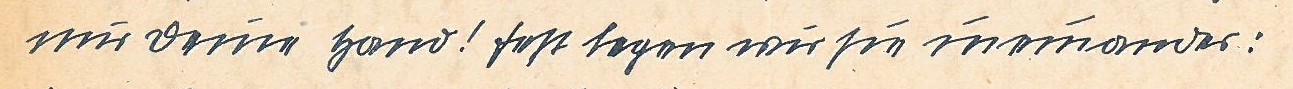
mir Deine Hand! Fest legen wir sie ineinander:
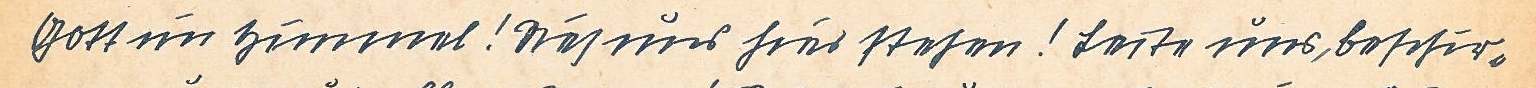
Gott im Himmel! Sieh uns hier stehen! Leite uns, beschir¬
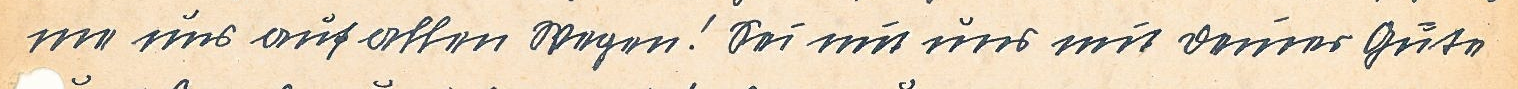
me uns auf allen Wegen! Sei bei uns mit Deiner Güte
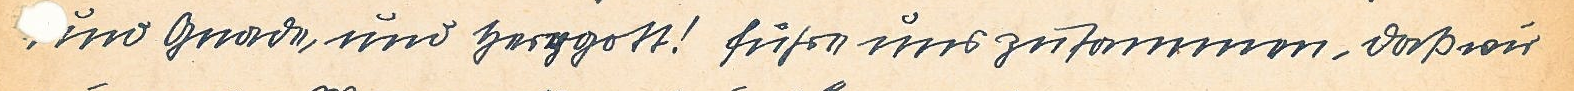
und Gnade, und Herrgott! Führe uns zusammen, daß wir
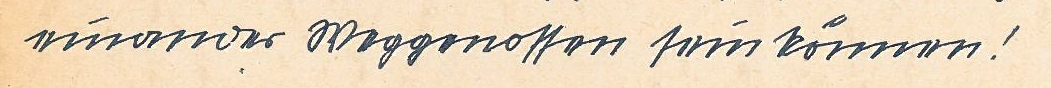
einander Weggenossen sein können!
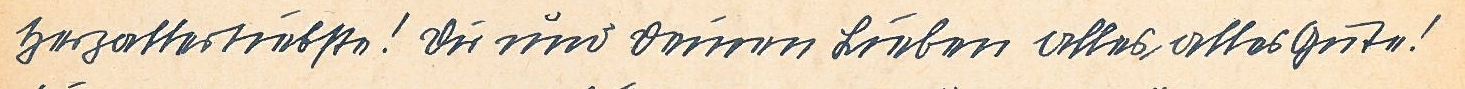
Herzallerliebste! Dir und Deinen Lieben alles, alles Gute!
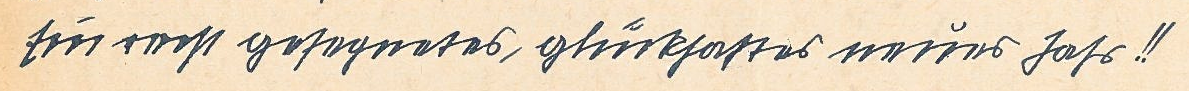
Ein recht gesegnetes, glückhaftes neues Jahr!!
